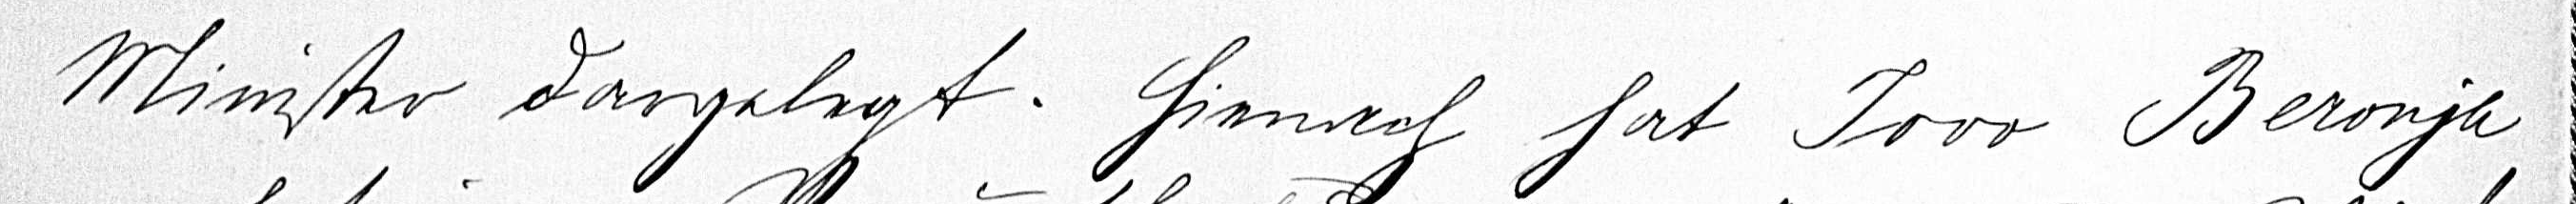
Minister dargelegt. Hienach hat Jovo Beronja
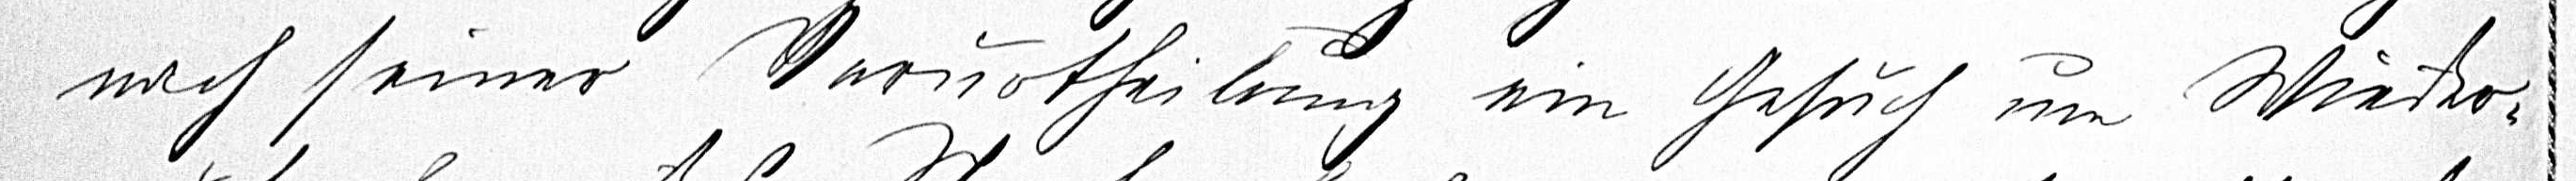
nach seiner Verurtheilung ein Gesuch um Wieder¬
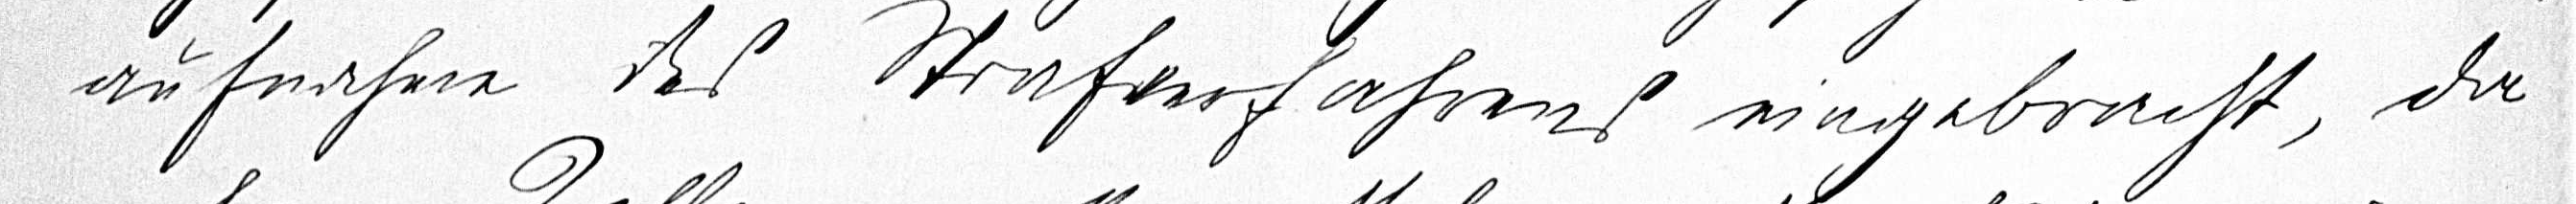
aufnahme des Strafverfahrens eigebracht, da
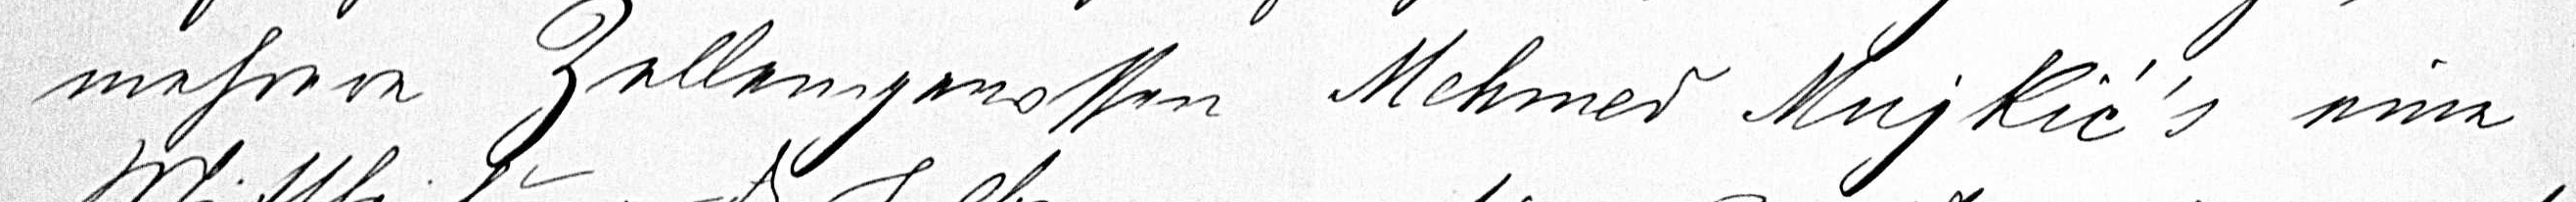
mehrere Zellengenossen Mehmed Mujkić's eine
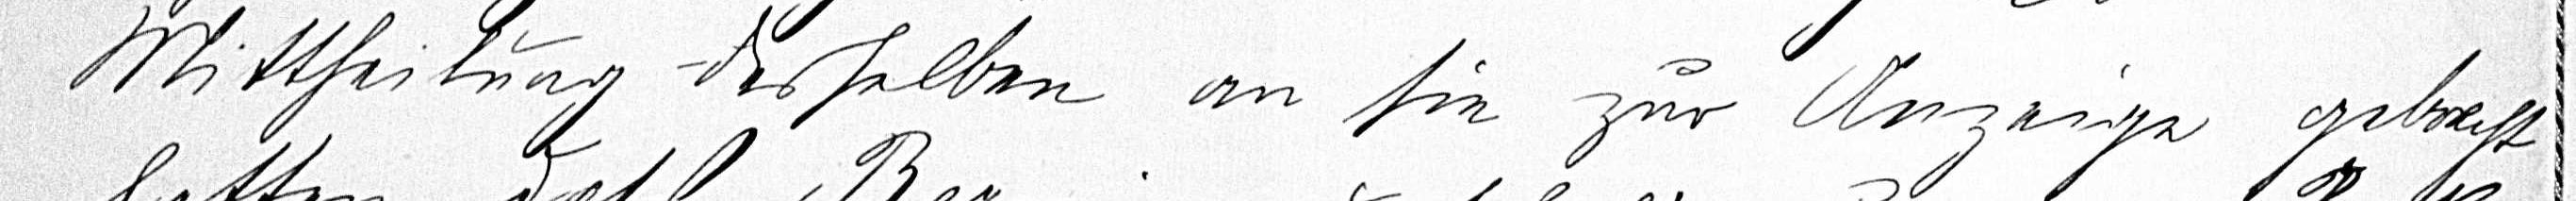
Mittheilung desselben an sie zur Anzeige gebracht
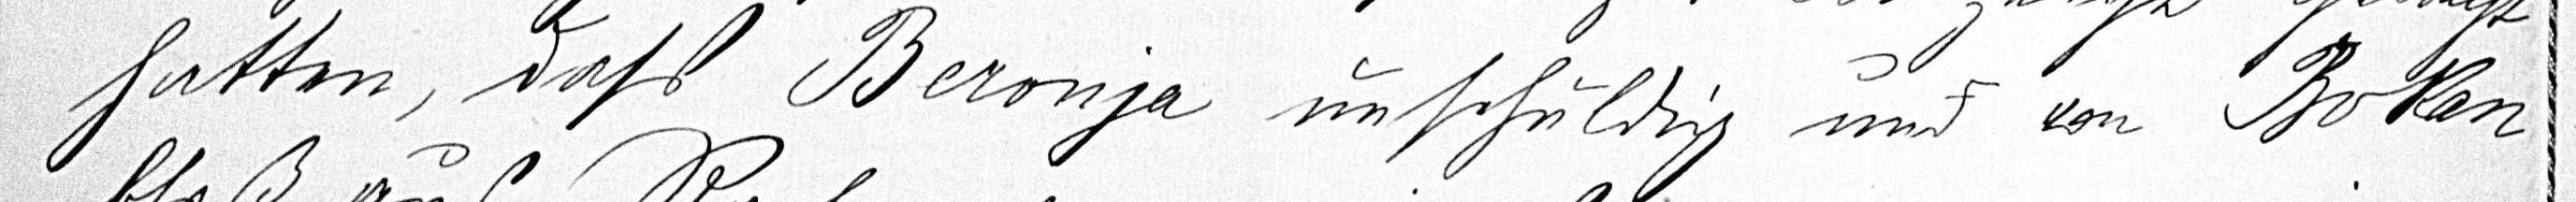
hatten, daß Beronja unschuldig und von Bokan
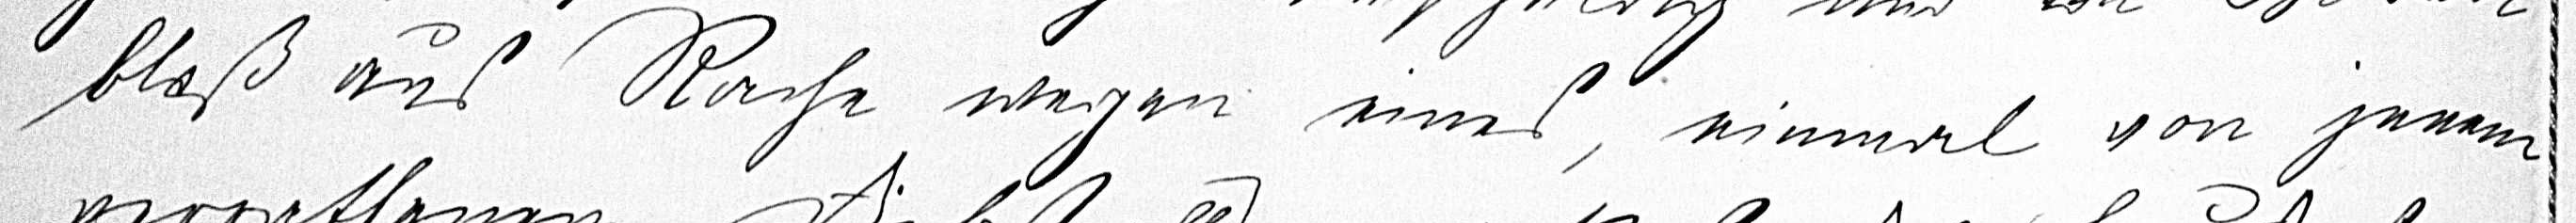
bloß aus Rache wegen eines, einmal von jene
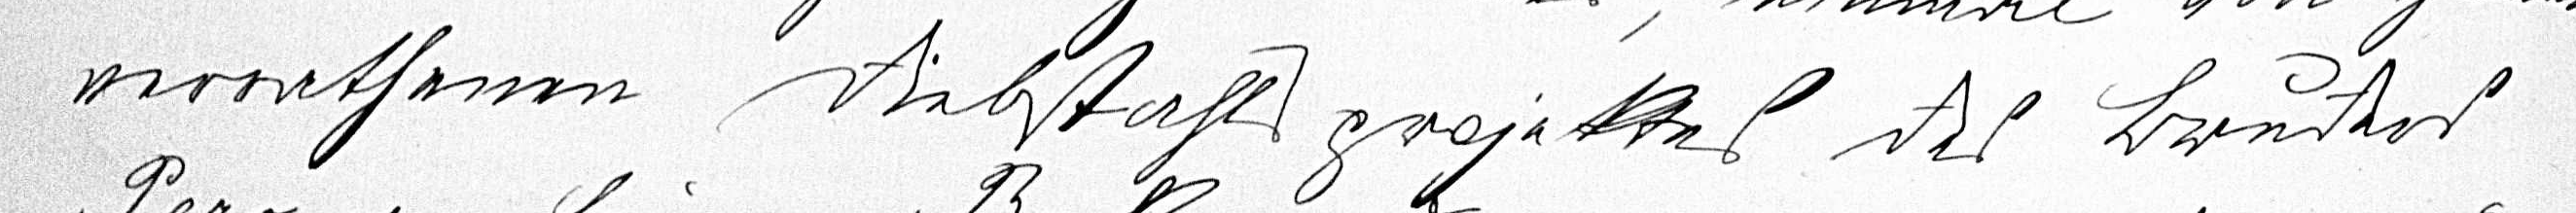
verrathenen Diebstahlsprojektes des Bruders
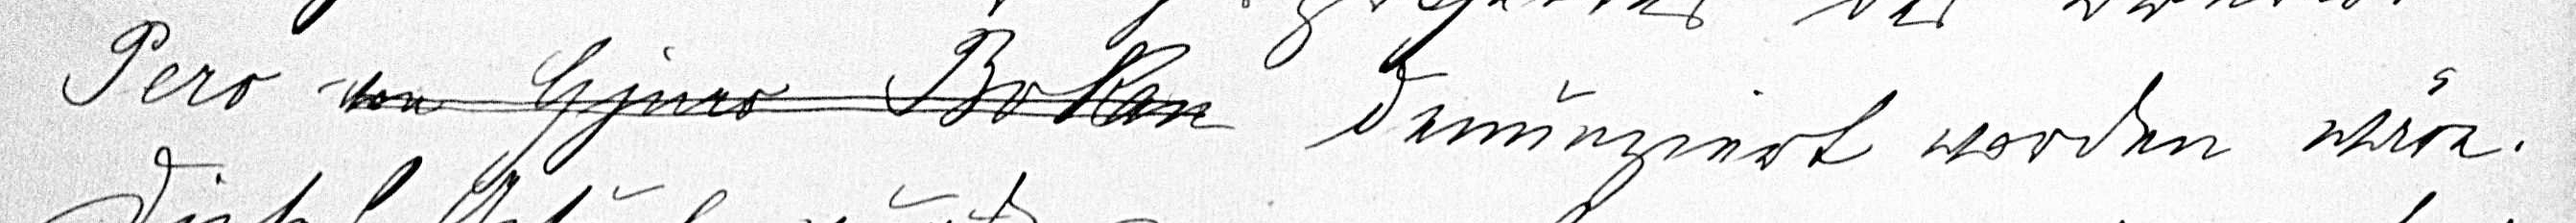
Pero denunziert worden wäre.
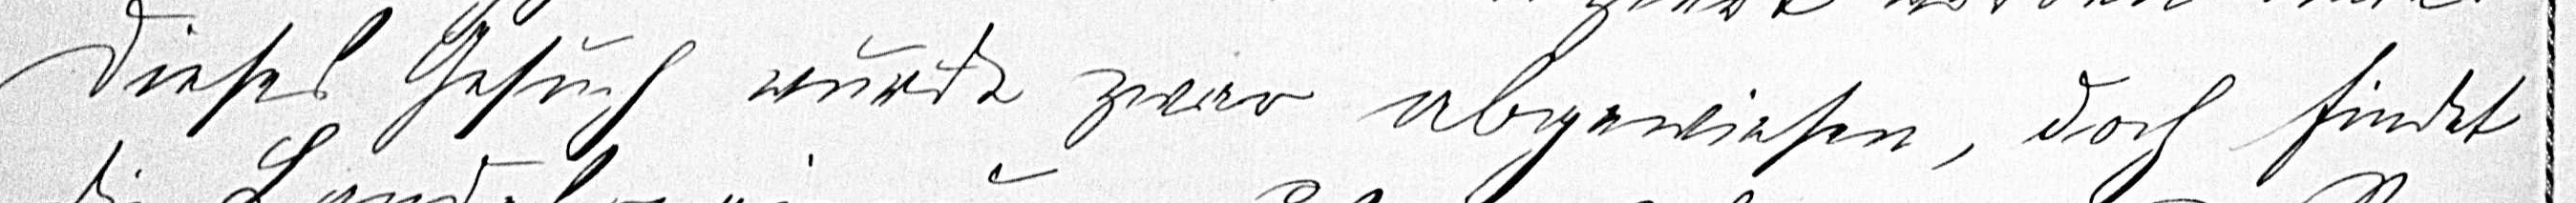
Dieses Gesuch wurde zwar abgewiesen, doch findet
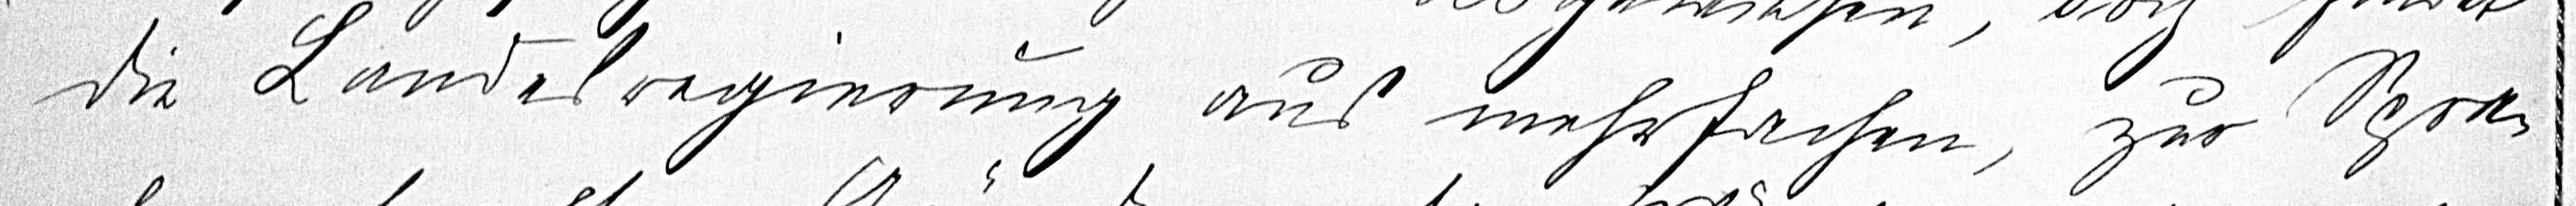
die Landesregierung aus mehrfachen, zur Spre¬
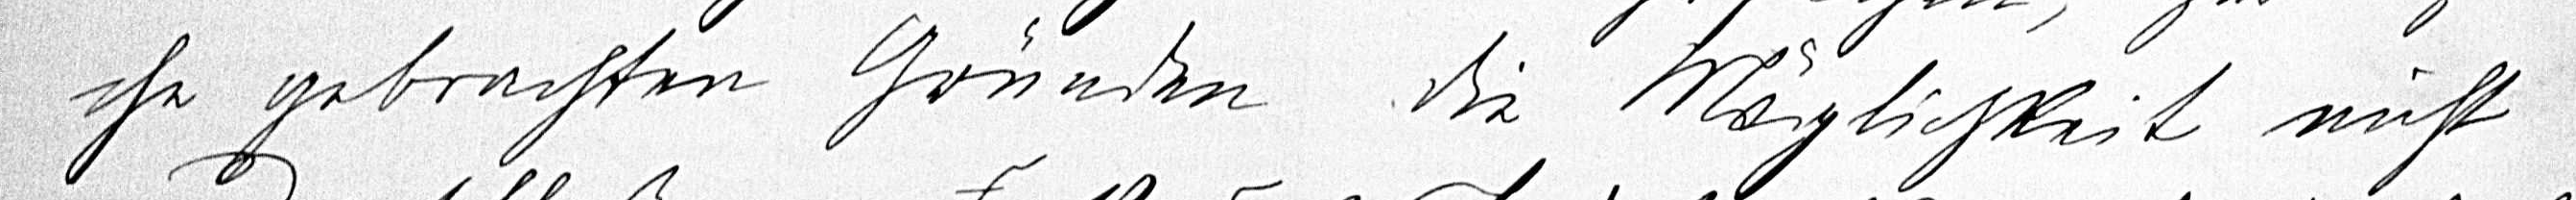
che gebrachten Gründen die Möglichkeit nicht
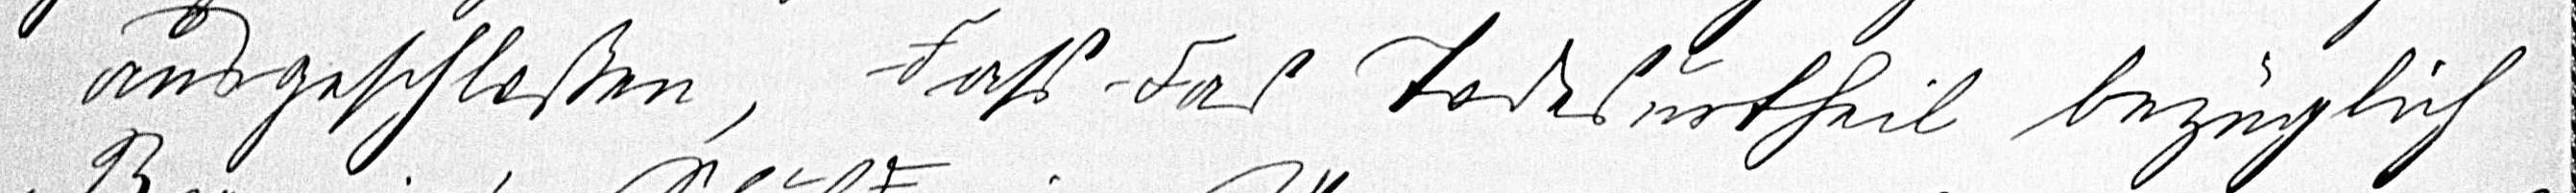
ausgeschloßen, daß das Todesurtheil bezüglich
